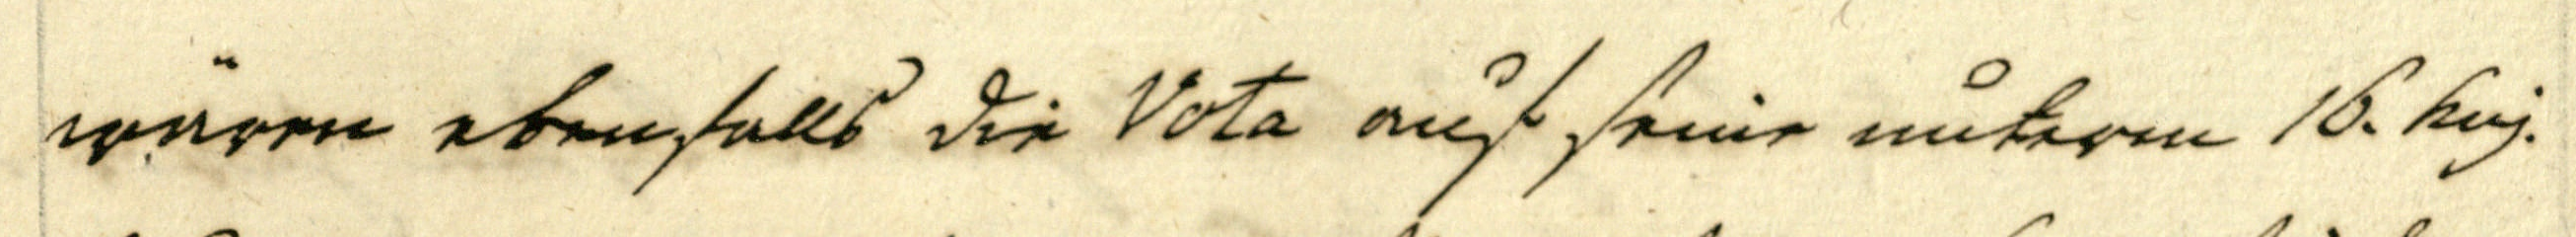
wären ebenfalls die Vota auf seine unterm 16. huj.
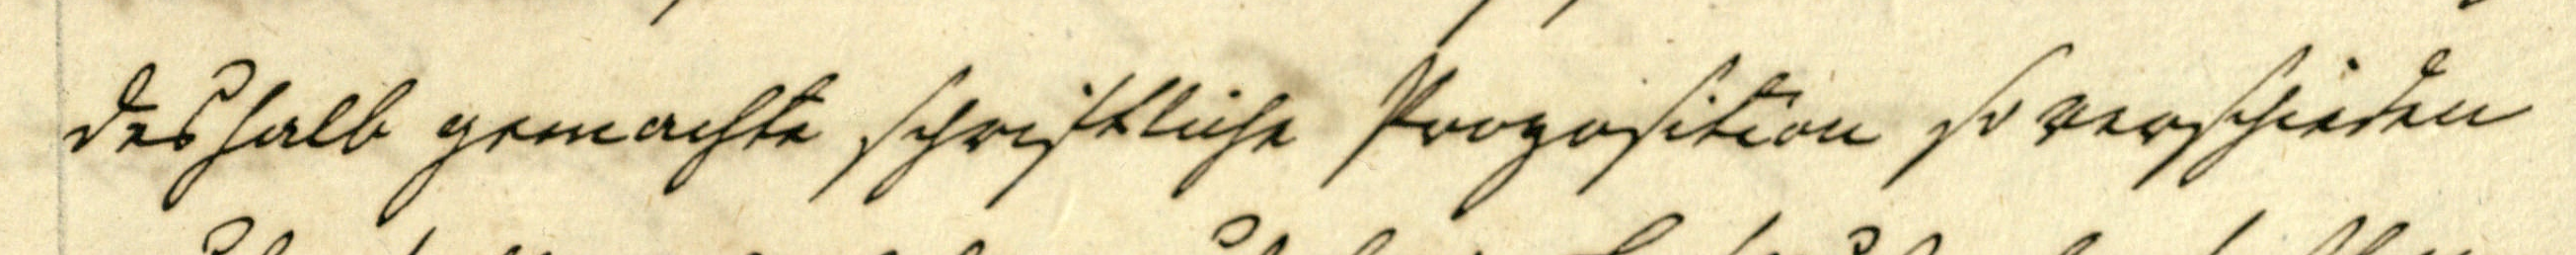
deshalb gemachte schriftliche Proposition so verschieden
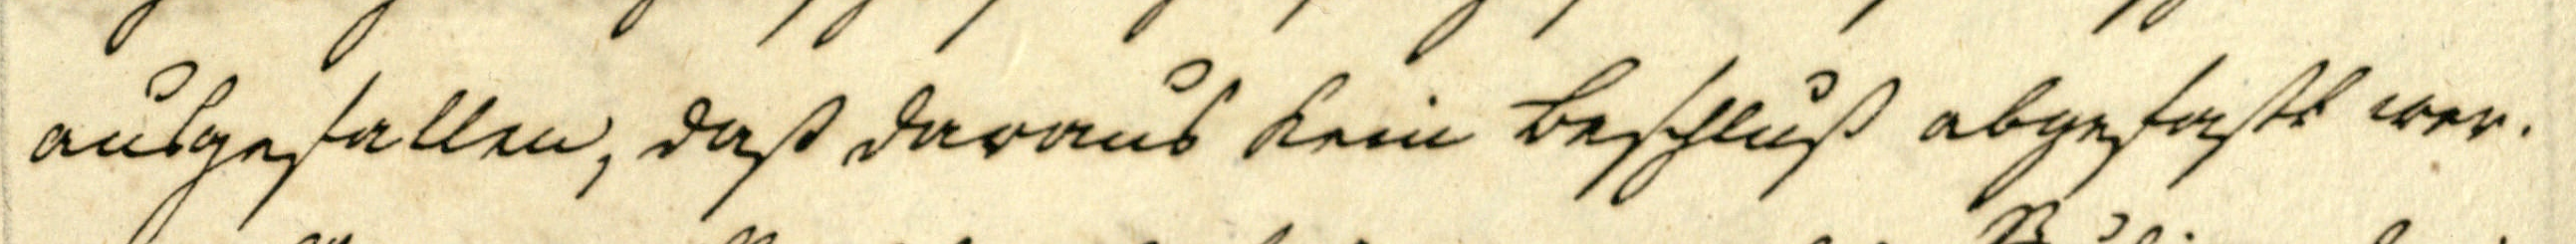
ausgefallen, daß daraus kein Beschluß abgefaßt wer¬
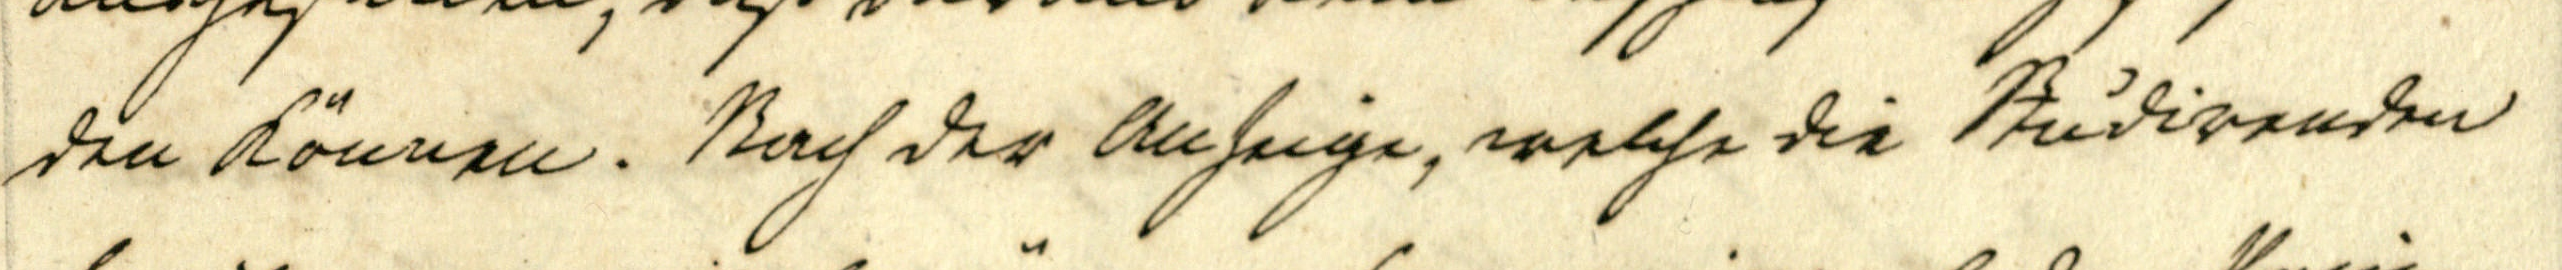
den können. Nach der Anzeige, welche die Studirenden
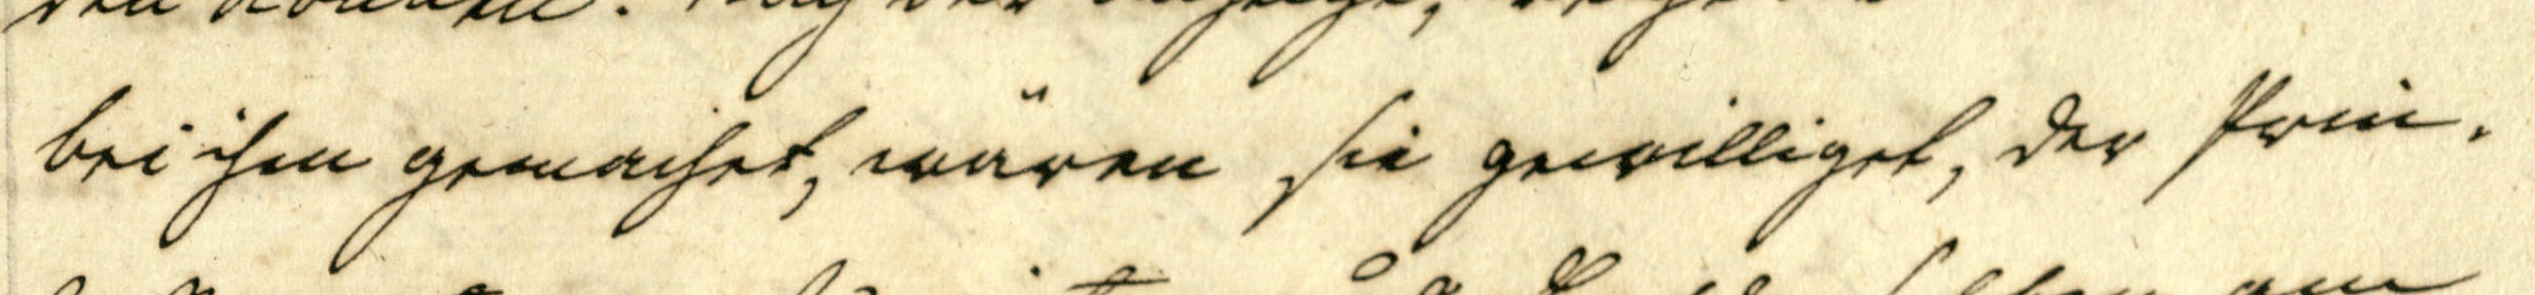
bei ihm gemachet, wären sie gewilliget, der Prin¬
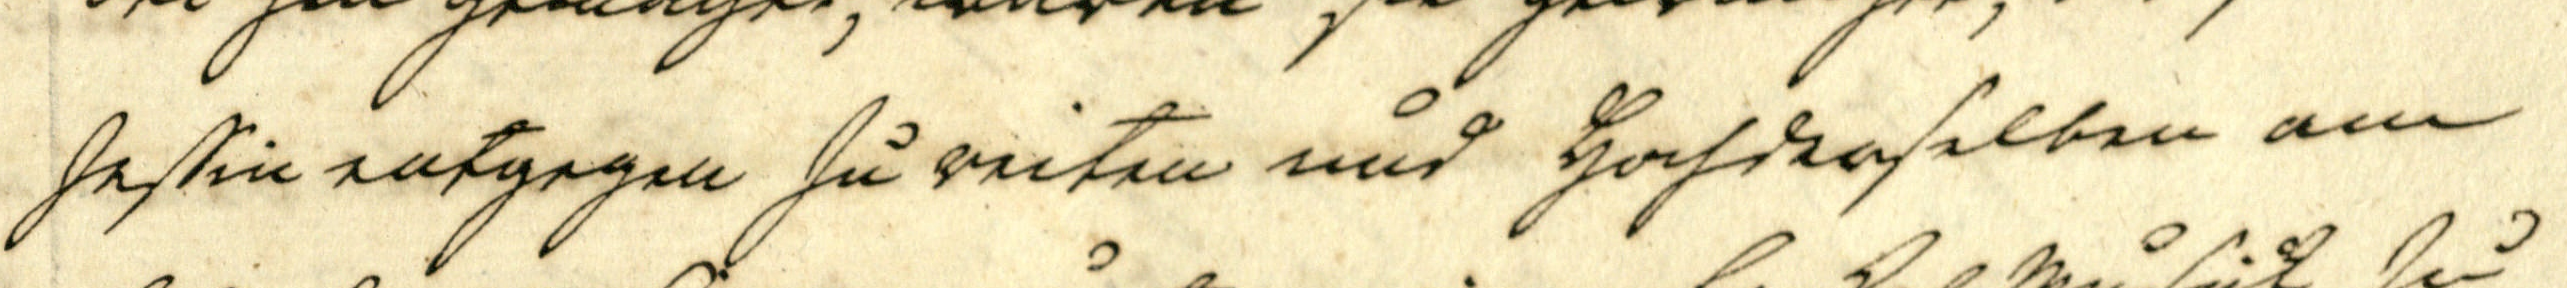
zessin entgegen zu reiten und Hochderselben am
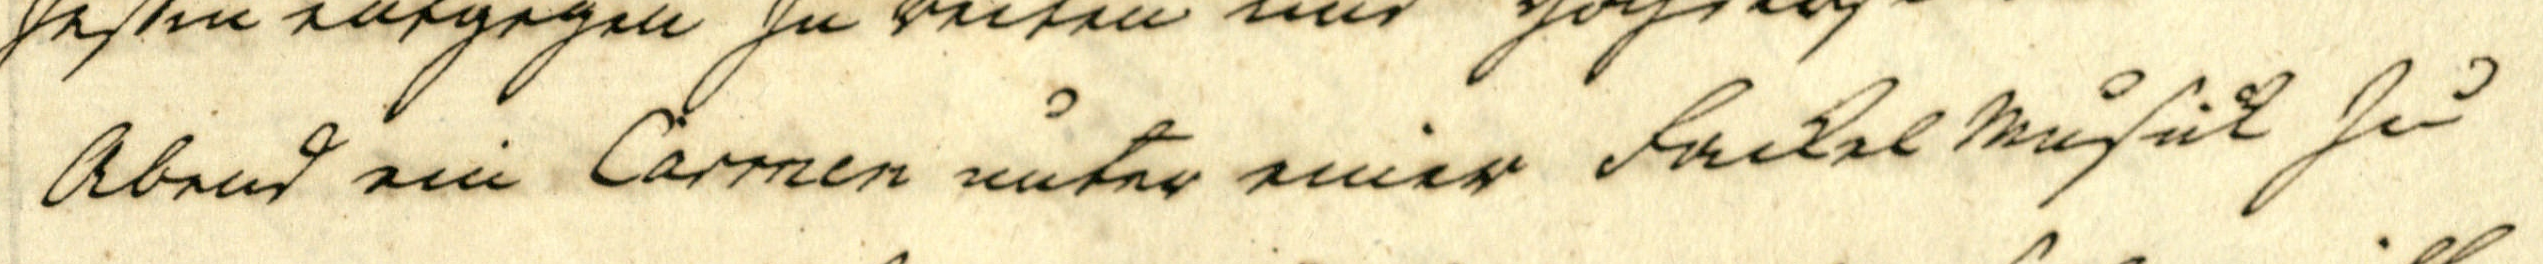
Abend ein Carmen unter einer Fackel Musick zu
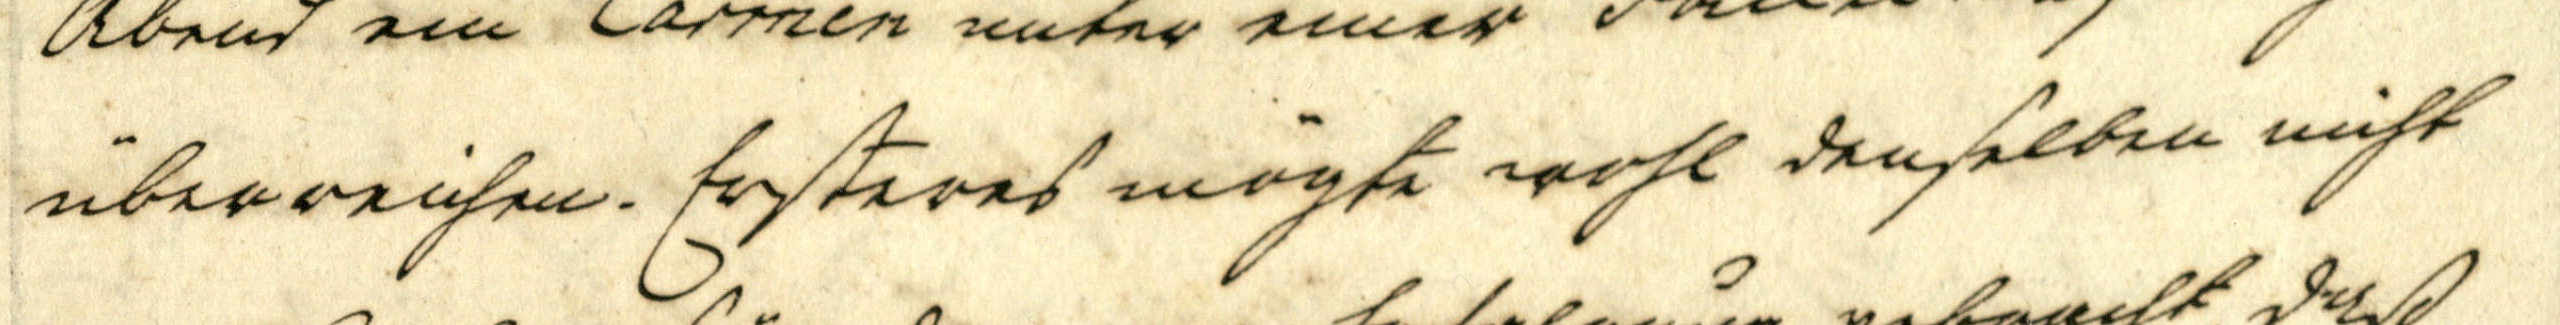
überreichen. Ersteres mögte wohl denselben nicht
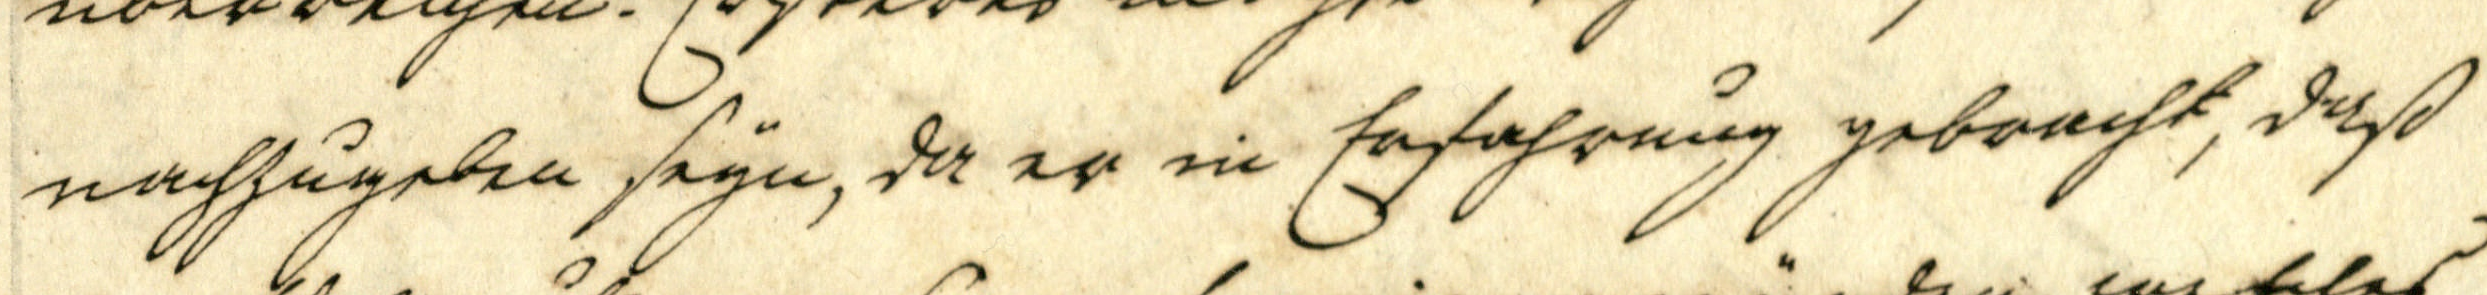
nachzugeben seÿn, da er in Erfahrung gebracht, daß
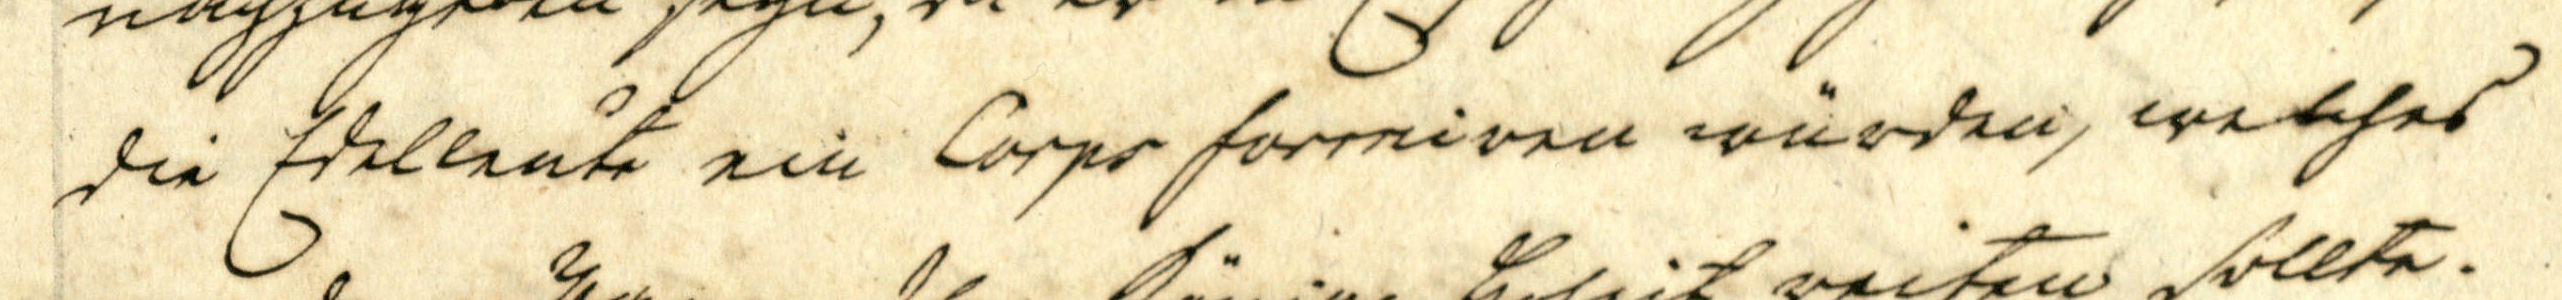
die Edelleute ein Corps formiren würden, welches
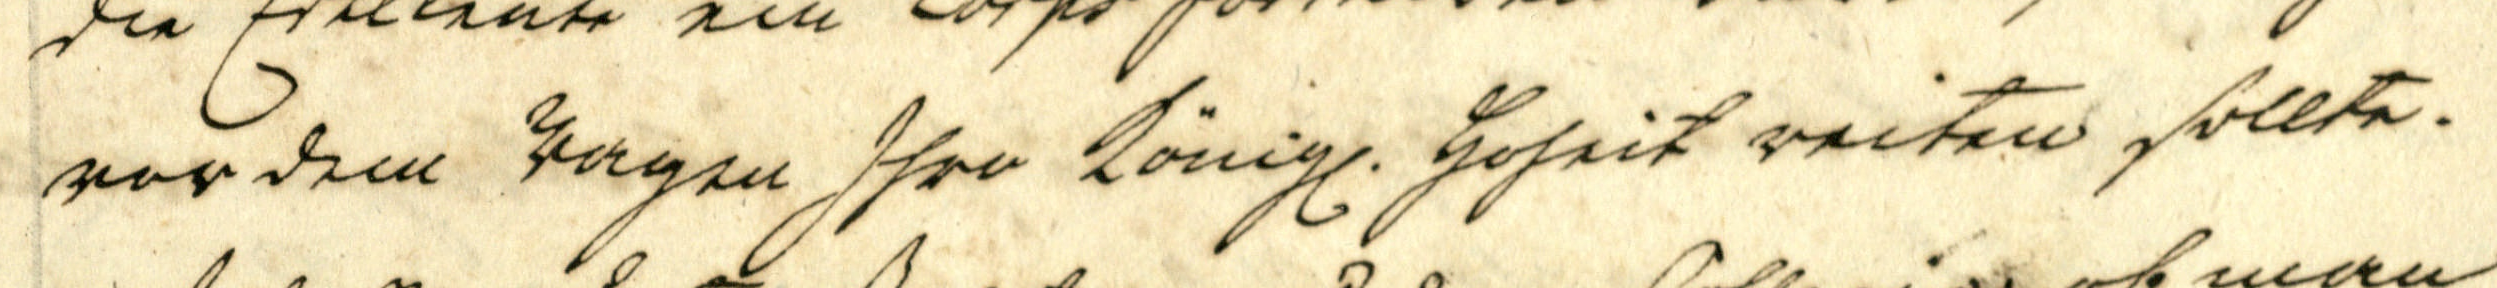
vor dem Wagen Ihro Königl. Hoheit reiten sollte.
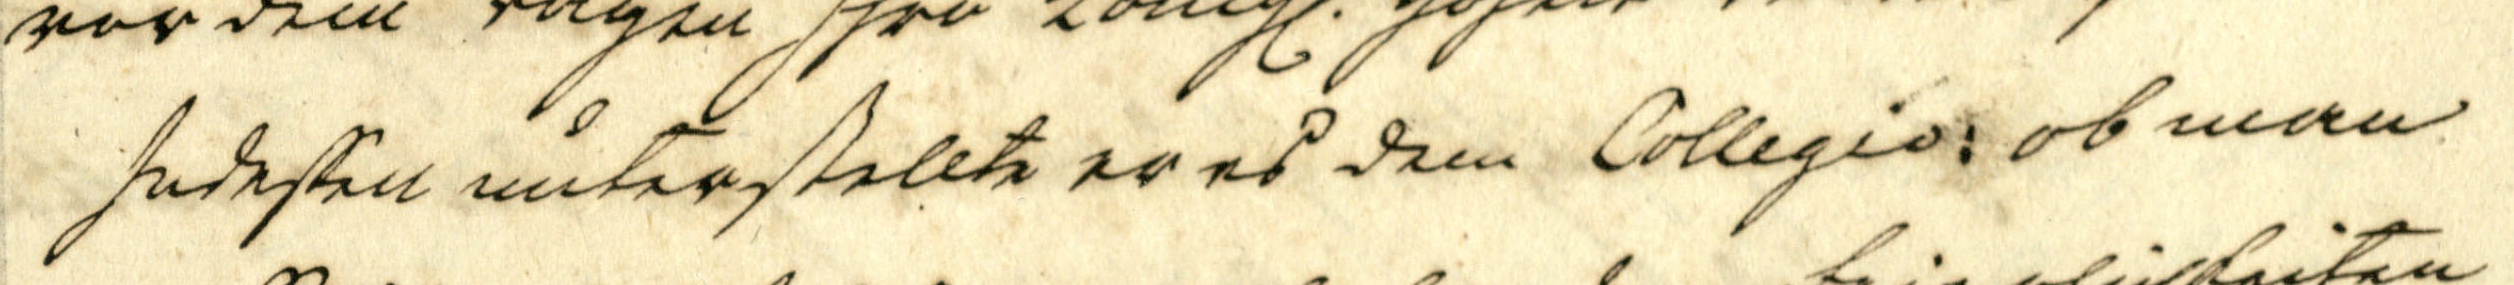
Indessen unterstellte er es dem Collegio: ob man
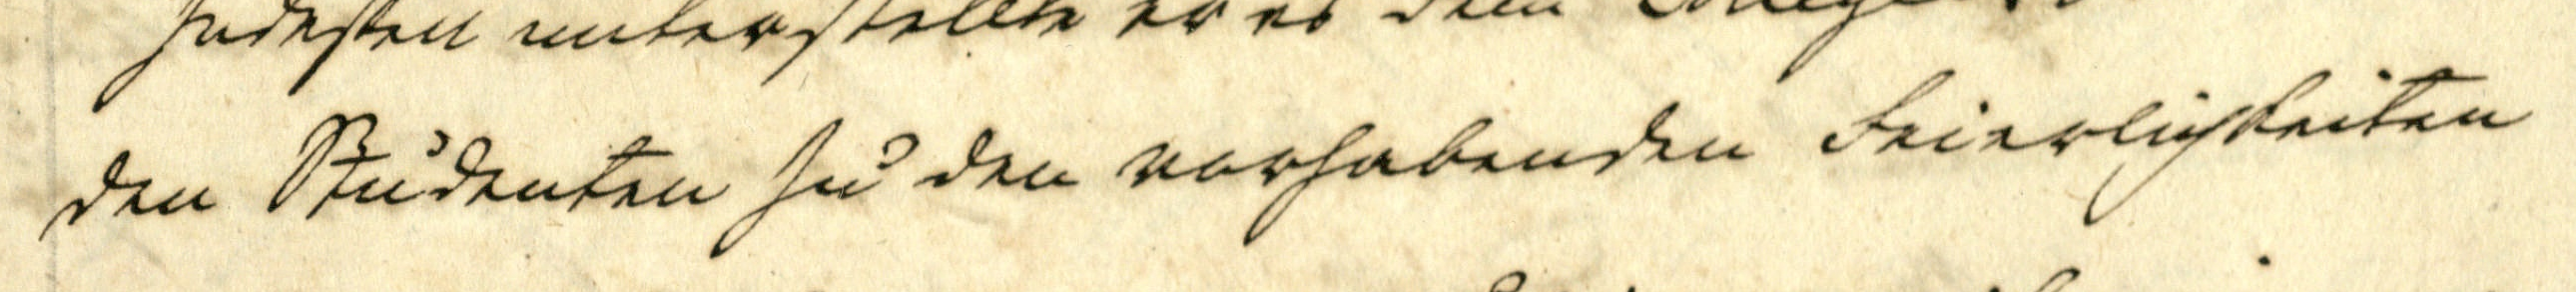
den Studenten zu den vorhabenden Feierlichkeiten
